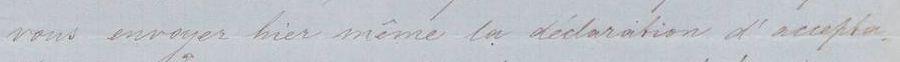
vous envoyer hier même la déclaration d'accepta-
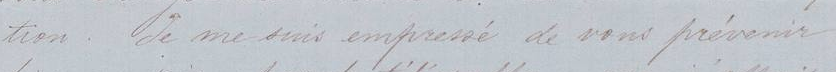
tion. Je me suis empressé de vous prévenir
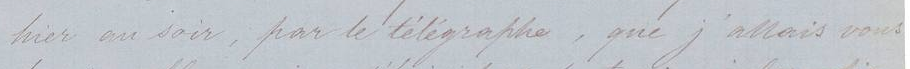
hier au soir, par le télégraphe, que j'allais vous
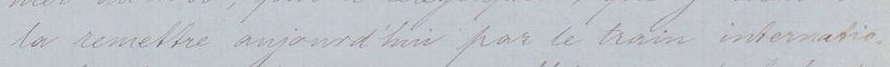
la remettre aujourd'hui par le train internatio-
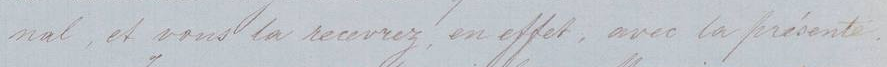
nal, et vous la recevrez, en effet, avec la présente.
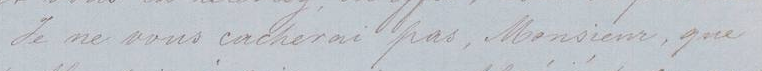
Je ne vous cacherai pas, Monsieur, que
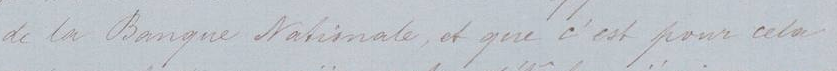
de la Banque Nationale, et que c'est pour cela
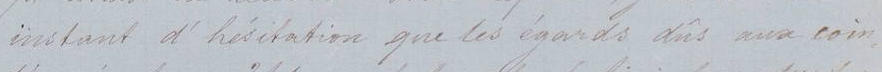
instant d'hésitation que les égards dûs aux coin-
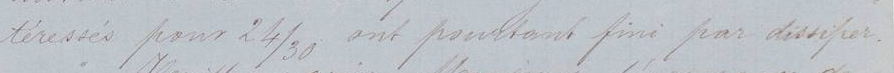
téressés pour 24/30 ont pourtant fini par dissiper.
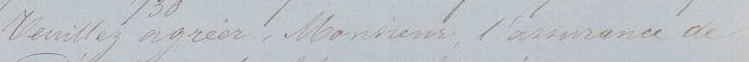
Veuillez agréer, Monsieur, l'assurance de
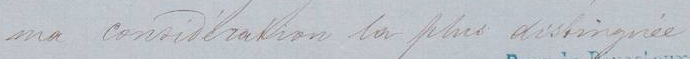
ma considération la plus distinguée
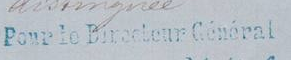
Pour le Directeur Général
